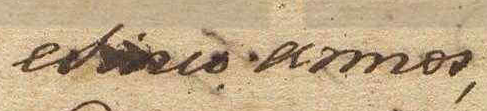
e sinco annos,
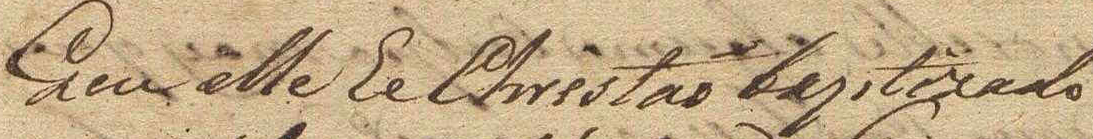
Que elle he Christaõ baptizado
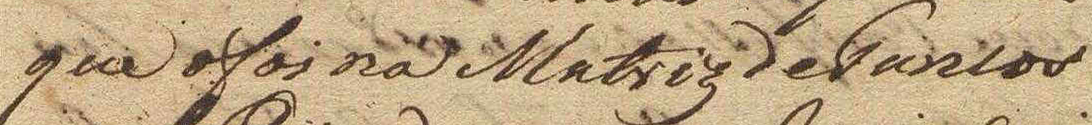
que o foi na Matriz de Tancos
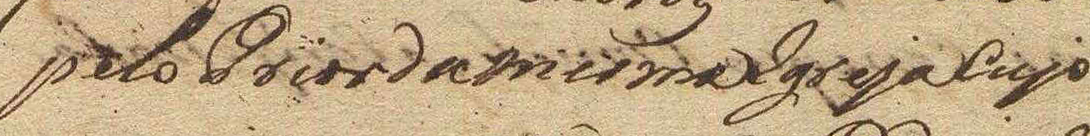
pelo Prior da mesma Igreja cujo
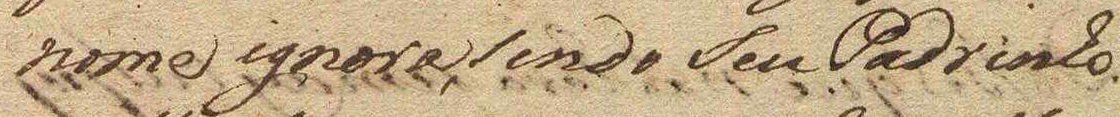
nome ignora, sendo seu Padrinho.
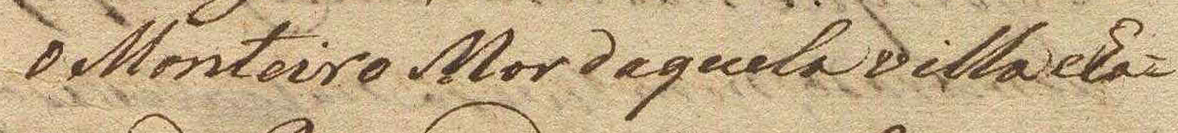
o Monteiro Mor daquela villa cha
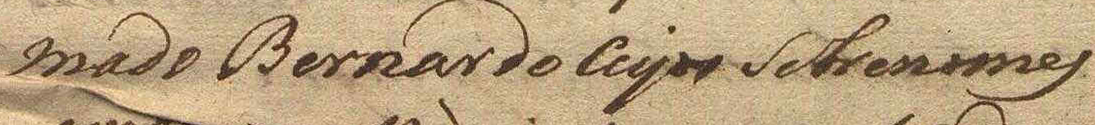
mado Bernardo cujos sobrenomes
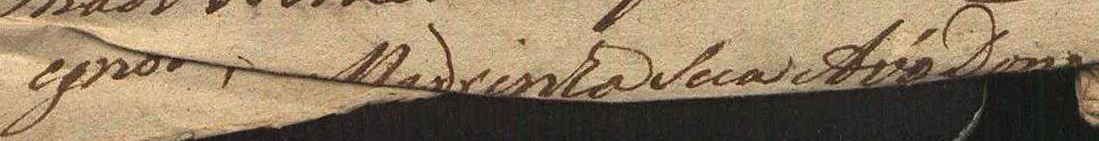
egno_ Madrinha sua Avó Dona
